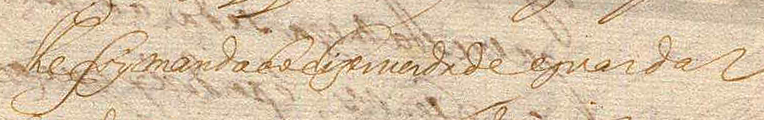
lhe foy mandado dizer uerdade e guardar
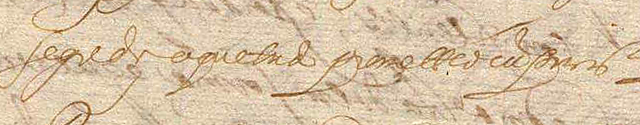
segredo o que tudo prometteo cūprir
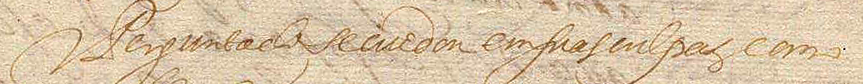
item Perguntado se cuidou em suas culpas como
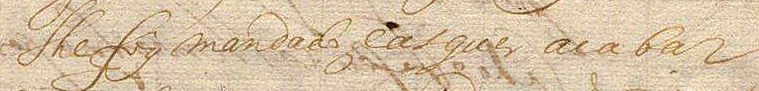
lhe foy mandado e as quer acabar
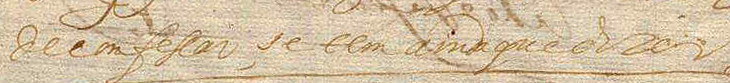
de confessar, se tem ainda que dizer
